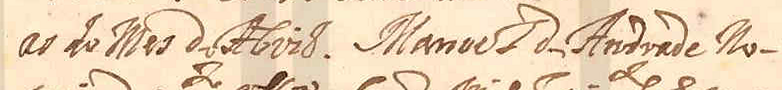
as do mes de Abril. Manoel de Andrade No
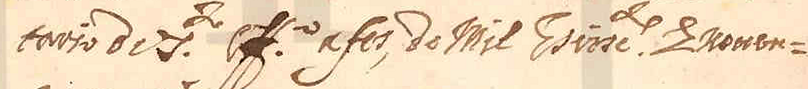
tario de s.to off.o a fes, de mil E seisc.tos E nouen
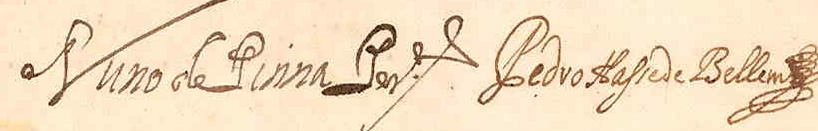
Nuno de Pinna Per.a Pedro Hasse de Bellem
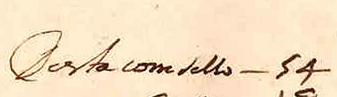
Desta com sello – 54
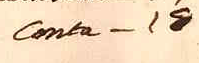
conta – 18
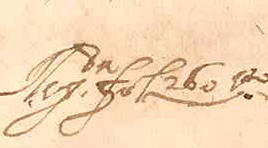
Reg.da fol 260 v.o
